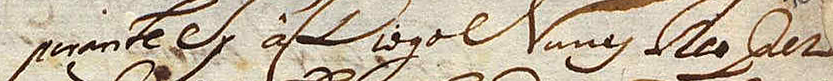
perante sy â Diogo Nunes Reo prezo
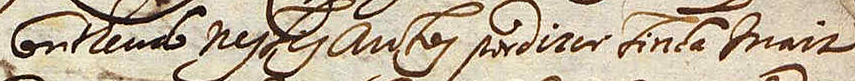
Contheudo nestes autos por dizer tinha maiz
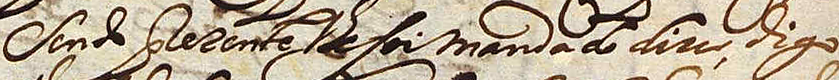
Sendo prezente lhe foi mandado dizer, digo
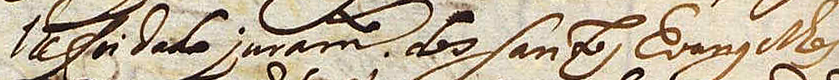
lhe foi dado juram.to dos Santos Evangelhos
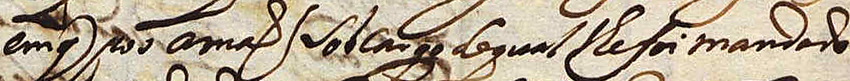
em q̄ pos a maõ sob cargo do qual lhe foi mandado
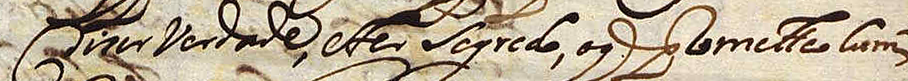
dizer Verdade, e ter segredo, o q̄ prometteo cum
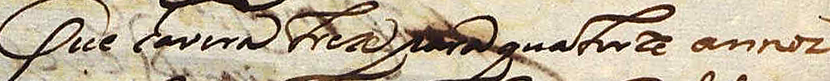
Que havera treze para quatorze annos
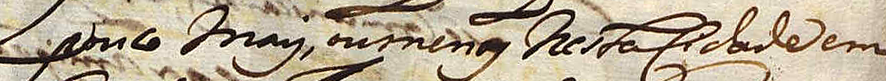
pouco mais, ou menos nesta Cidade em
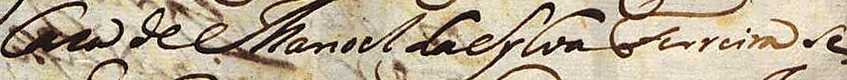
Caza de Manoel da Sylva Ferreira se
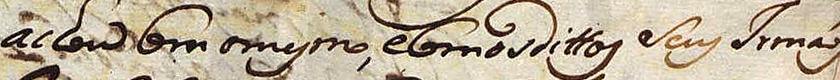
achou Com o mesmo, e Com os dittos seus Jrmãos
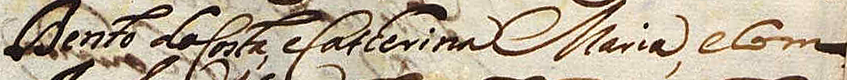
Bento da Costa, e Catherina Maria, e com
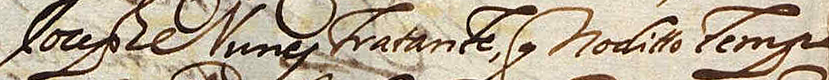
Jozeph Nunes tratante, q̄ no ditto temp
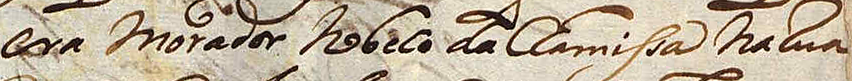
era morador no beco da Chamissa na Rua
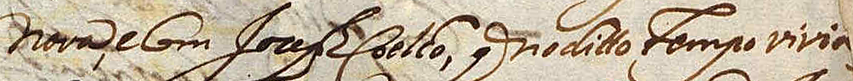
Nova, e com Jozeph Coelho, q̄ no ditto tempo vivia
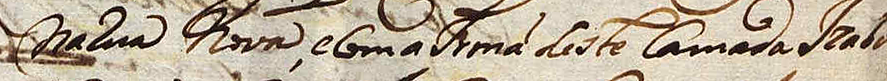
na Rua Nova, e com a Jrmã deste Camada Jzab
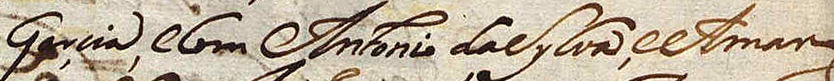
Garçia, e Com Antonio da Sylva, e Amaro
